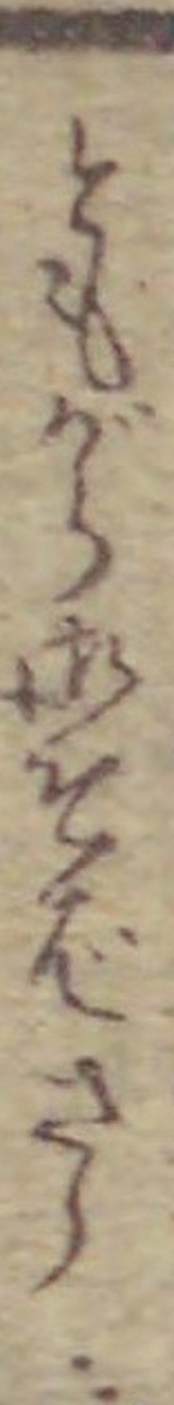ともがら御そばさら

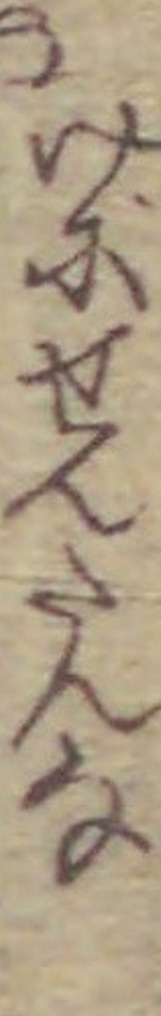げにせんたんな
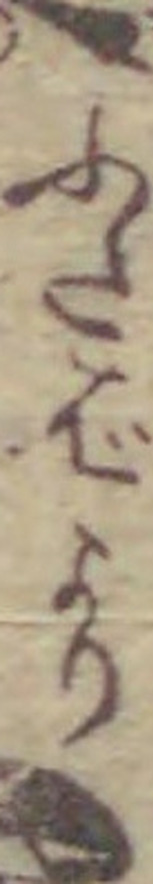ふたばより
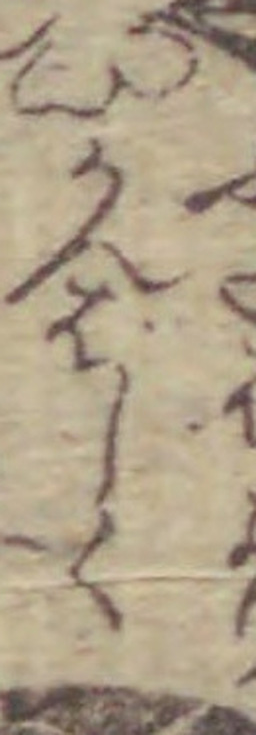かんばしく
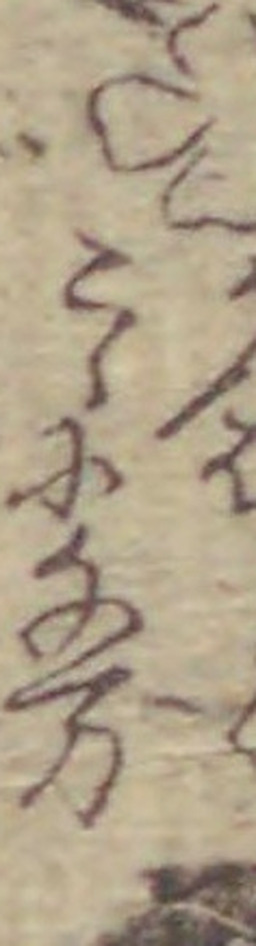こゝに千万
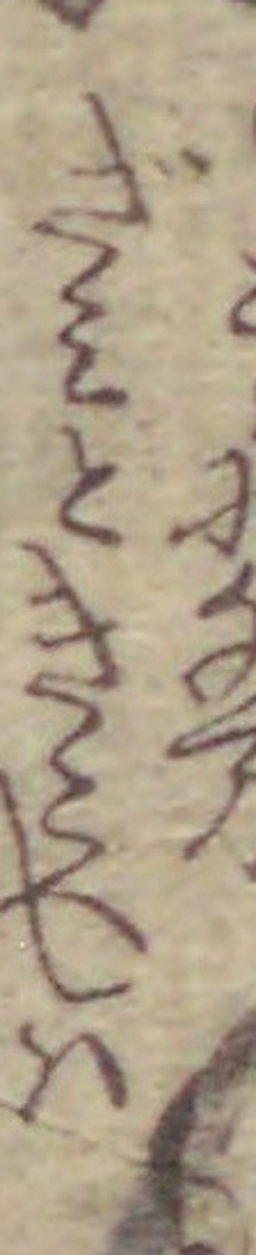ぎみときこへしは
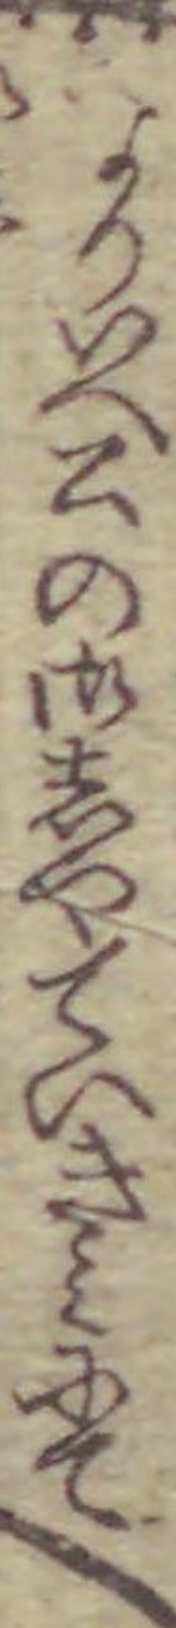よりいへ公の御しやていきみにて
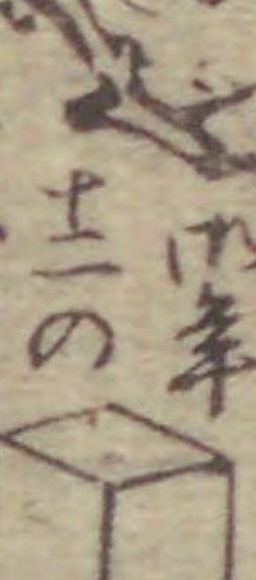十二の
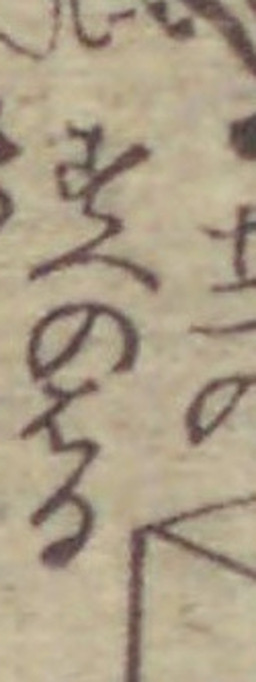すへのはる
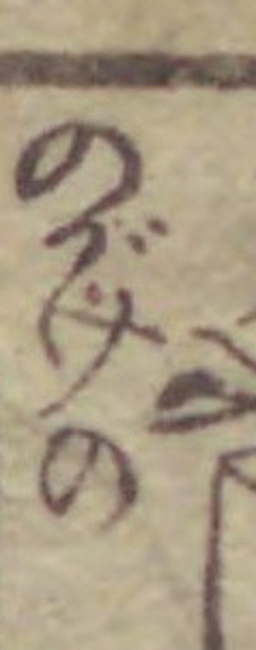のがけの
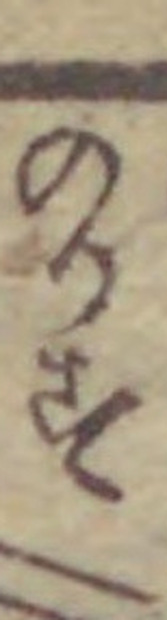のりす
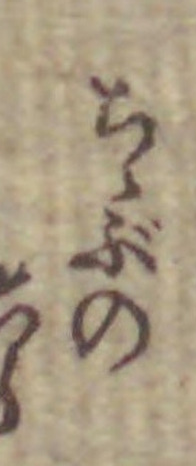ちゝぶの
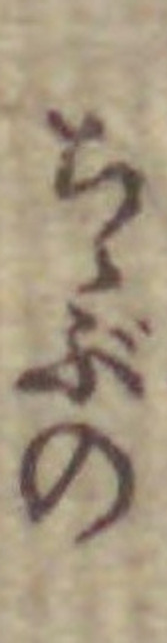ちゝぶの
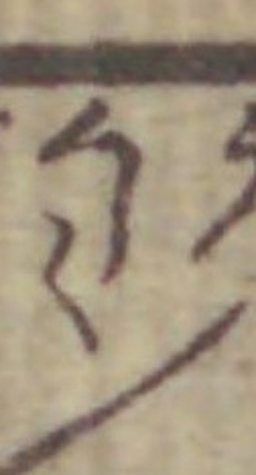くしく
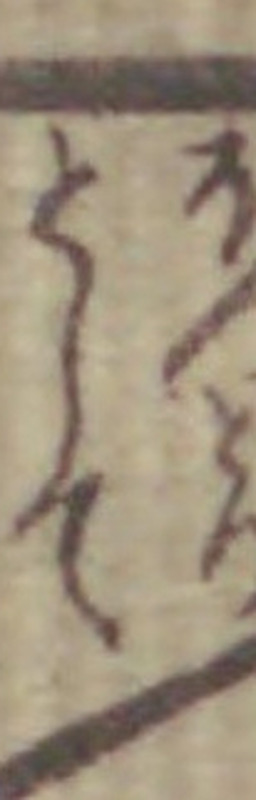として
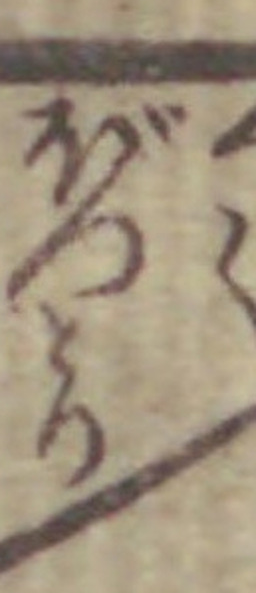ぼつとり
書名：鎌倉山紅葉浮名
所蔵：国立国会図書館 National Diet Library, JAPAN
